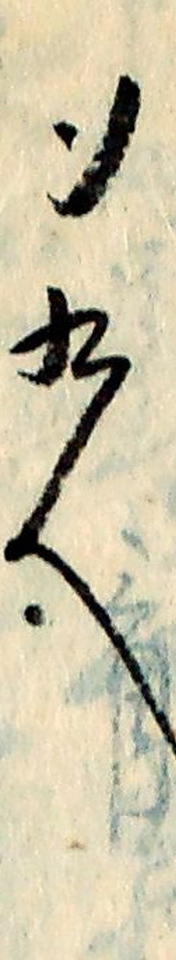〆九人
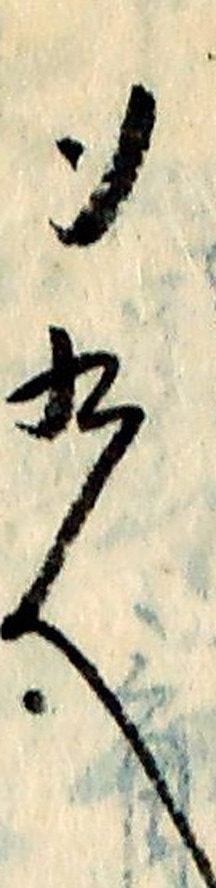〆九人
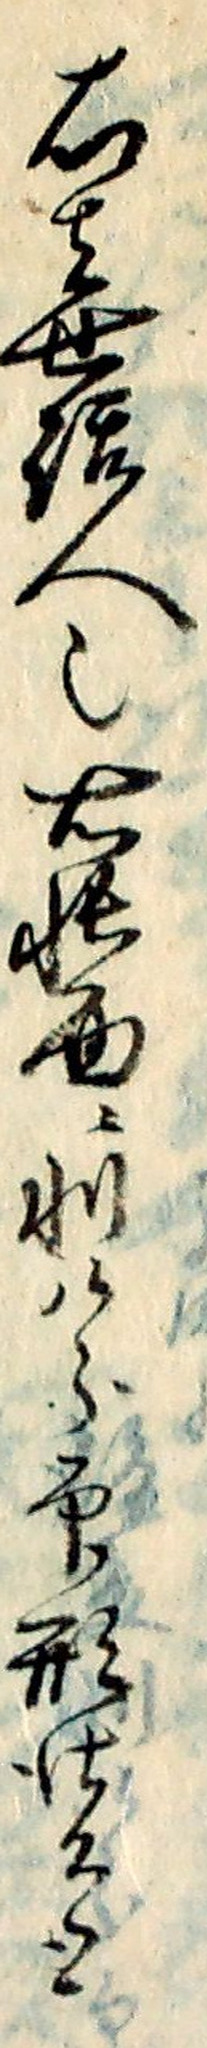右は世話人也右帳面に利八郎印形仕候以上
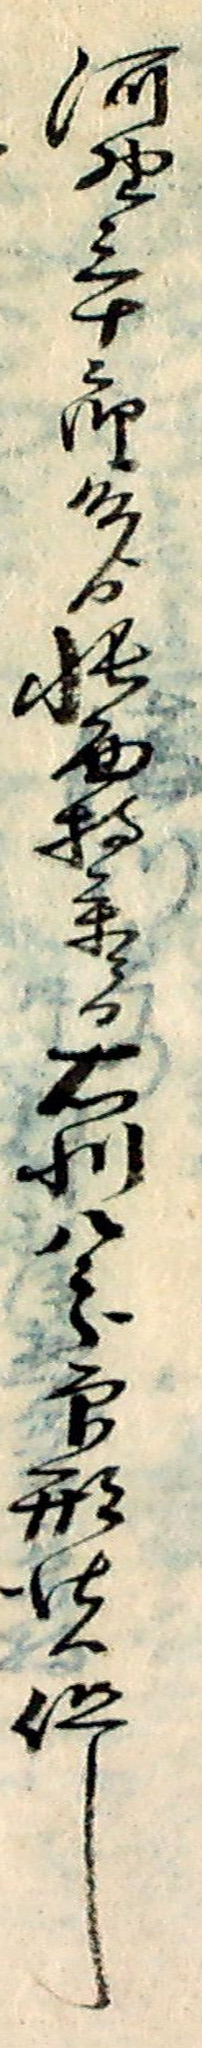河野三十郎殿ゟ帳面持参にて右利八郎印形仕候但し
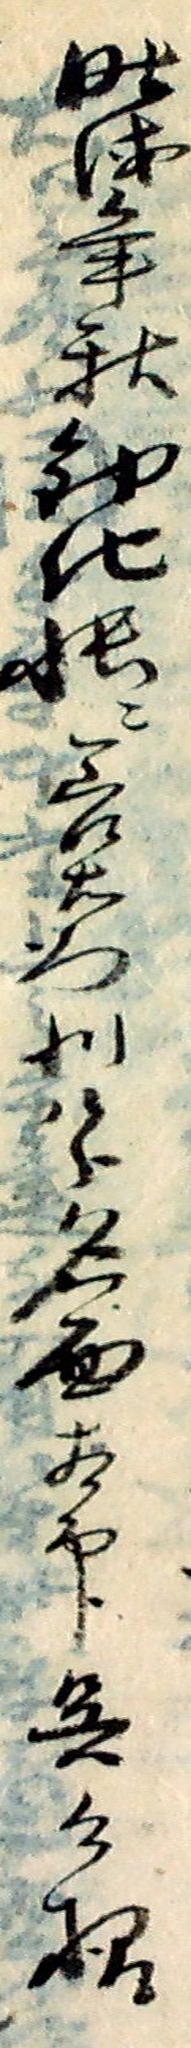昨戌年秋勧化帳に善右衛門利八郎名面相印呉候様
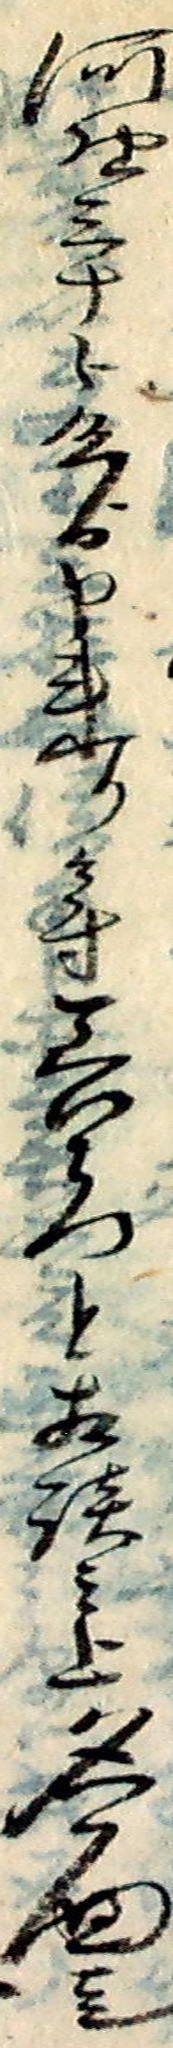河野三十郎殿ゟ申来り候付善右衛門と相談之上名面迄
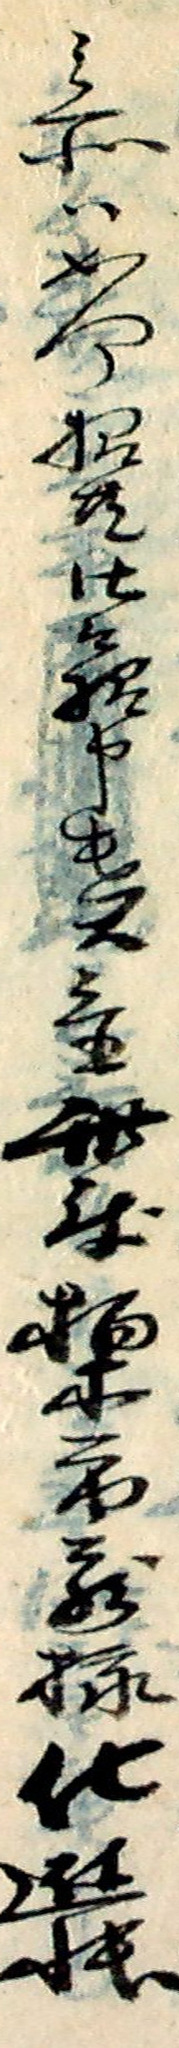之所は如何様共仕候様申遣す置此度柏木市蔵様化進帳
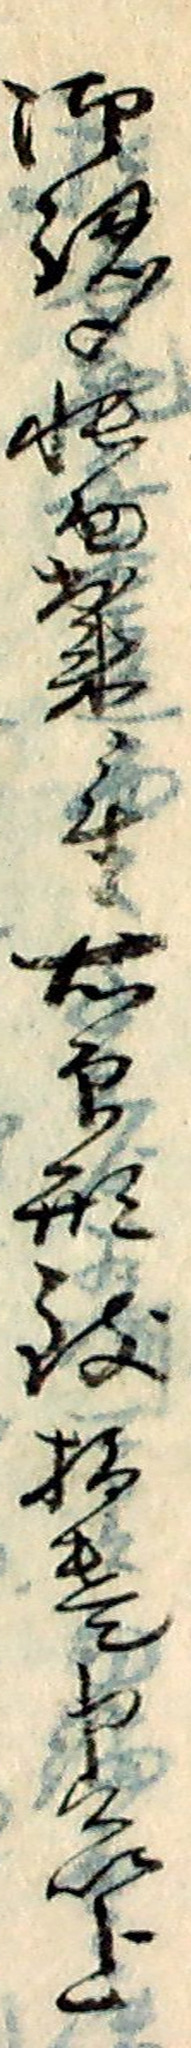御認め帳面出来候に付右印形致指遣し申候以上
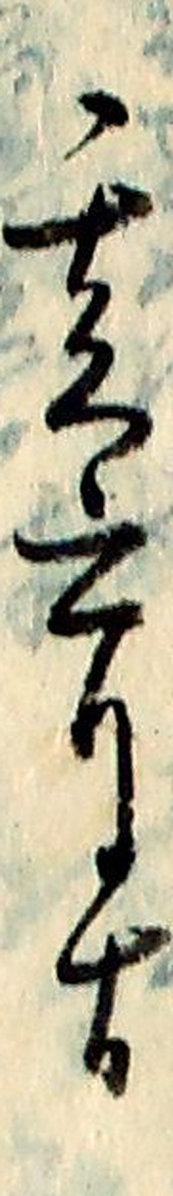亥六月十日
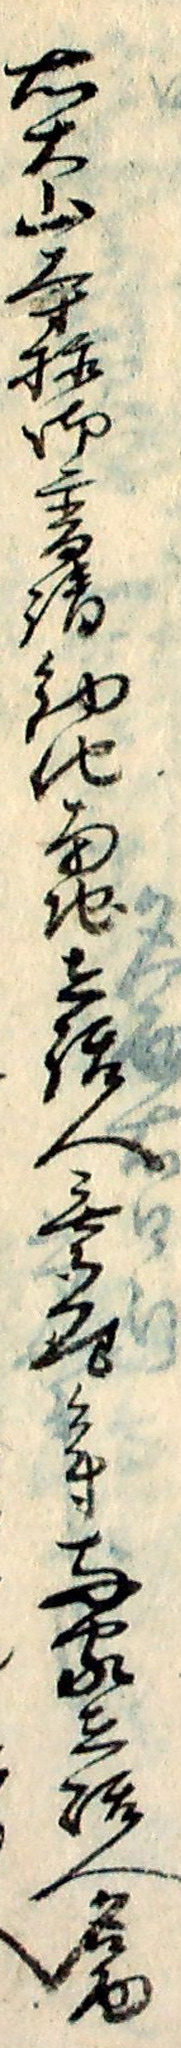右大山寺様御普請勧化当地世話人無御座候付両家世話人名面
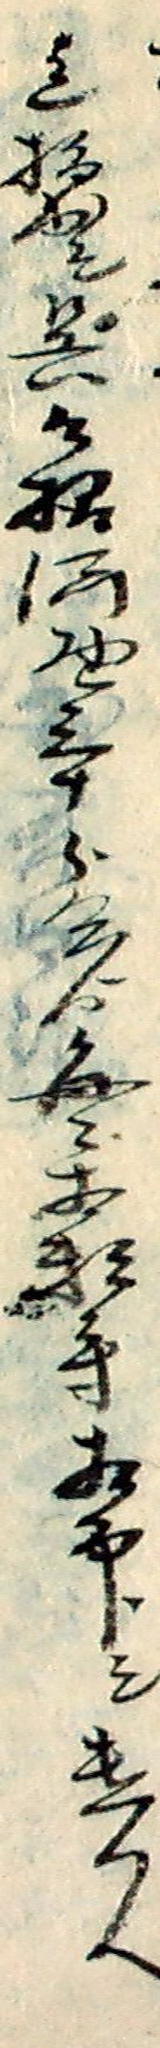迄指出し呉候様河野三十郎殿ゟ毎々相頼候付相印し遣す
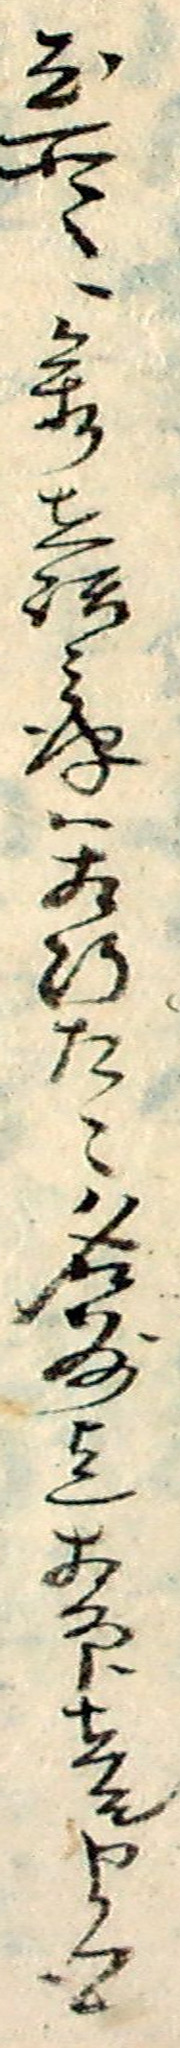尤所々へ参り世話之儀は相断たゝ名前迄相印し申候以上

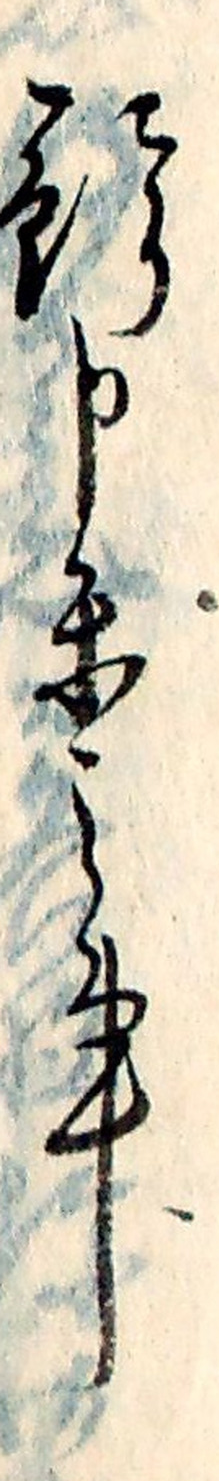預申米之事
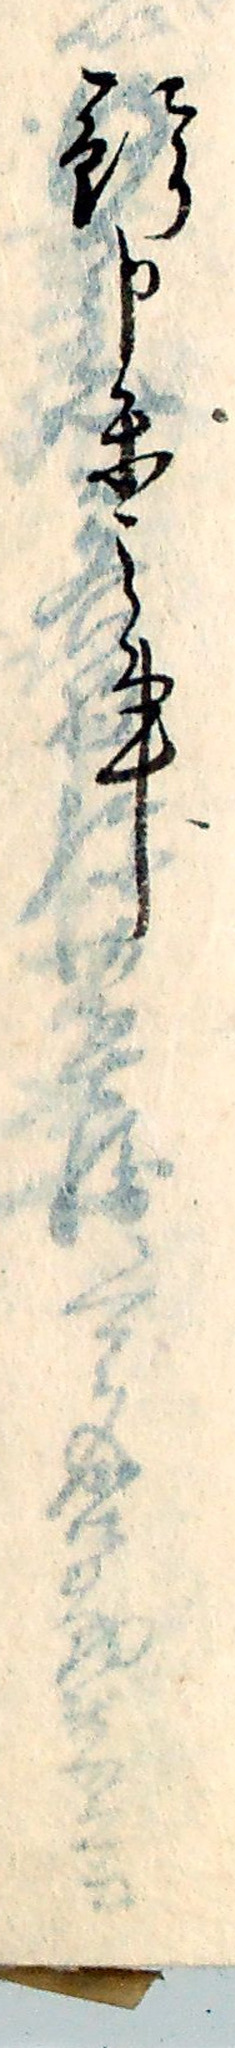預申米之事
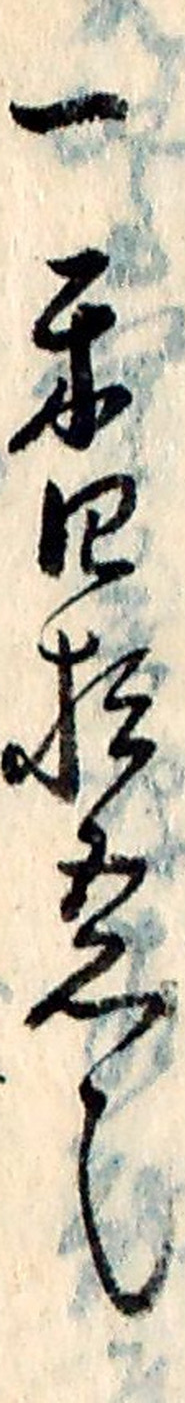一米四拾五石也
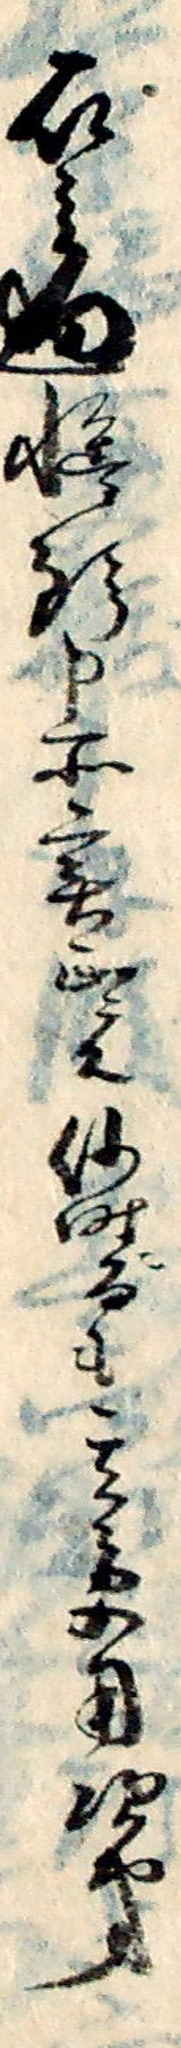右之通慥に預申所実正に候何時にても其方入用次第
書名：諸御願書控(後藤氏壱番）
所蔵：鳴門教育大学 Naruto University of Education
